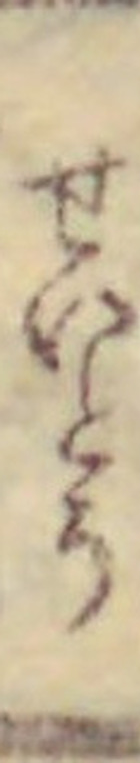せいとう
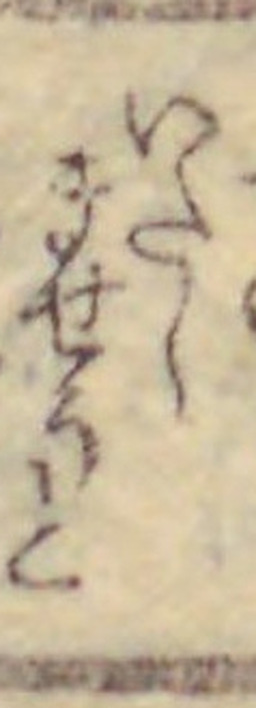ませうと
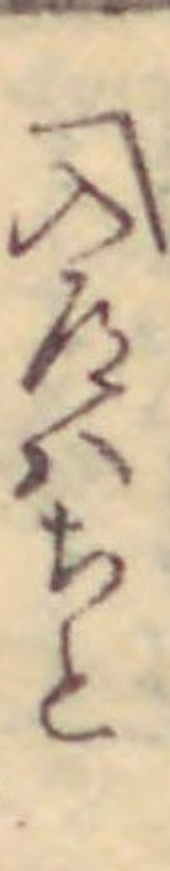〽入道はちと
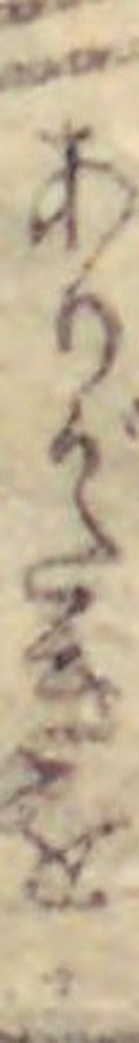ありがたきを
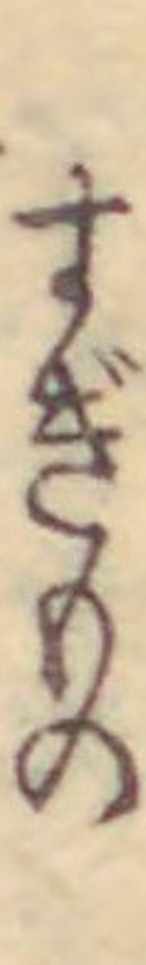すぎもの
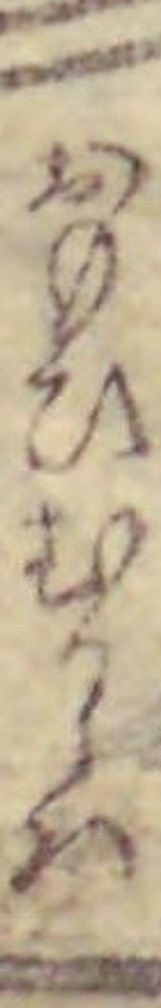おもひむかしは
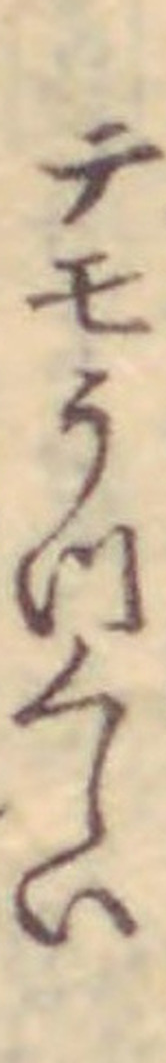テモうつくしい
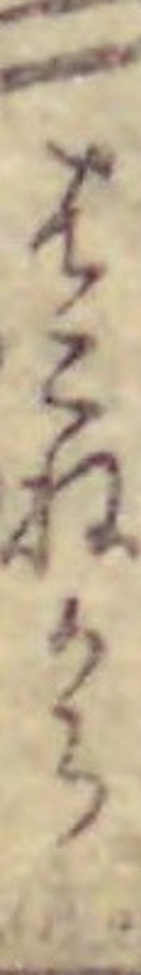はこねから
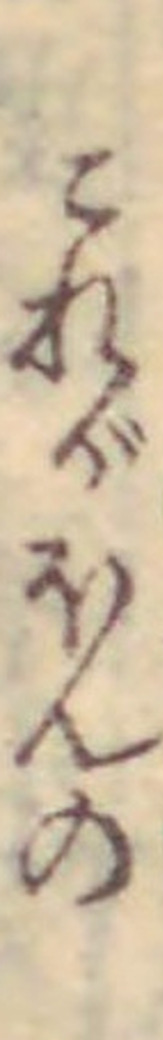これがほんの
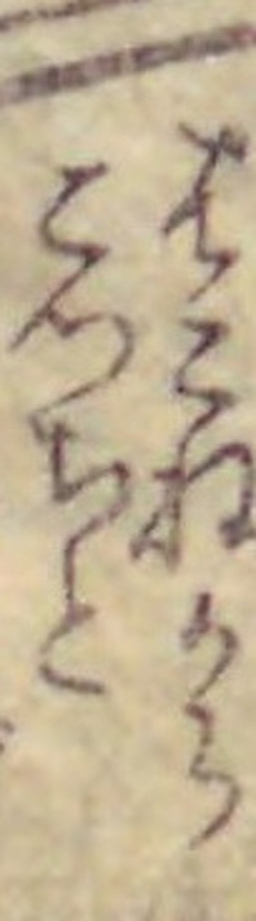こつちと
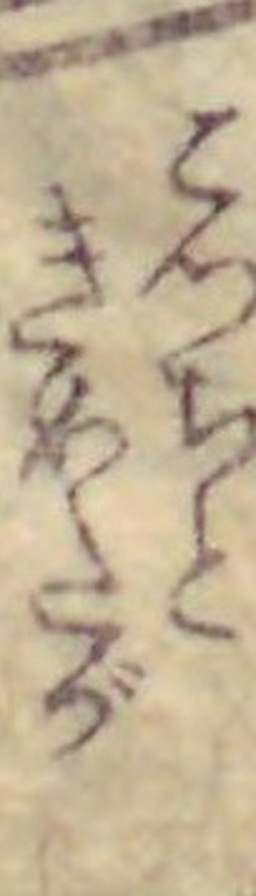きめたが
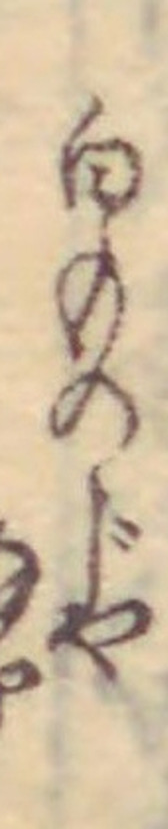白ものじや
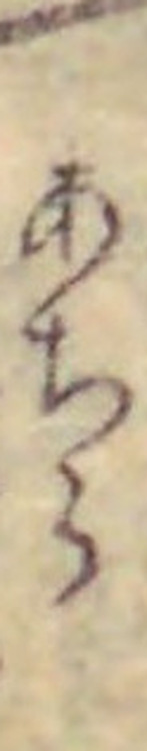あちら
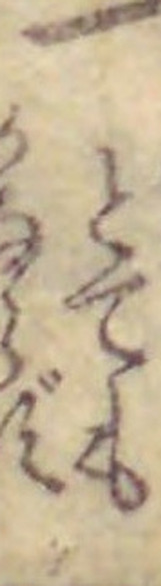とても

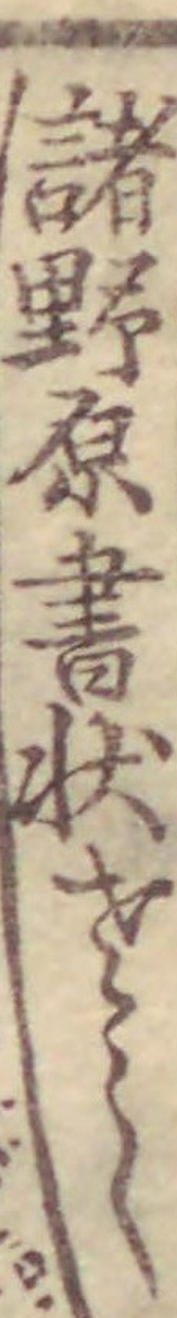諸野原書状をこし
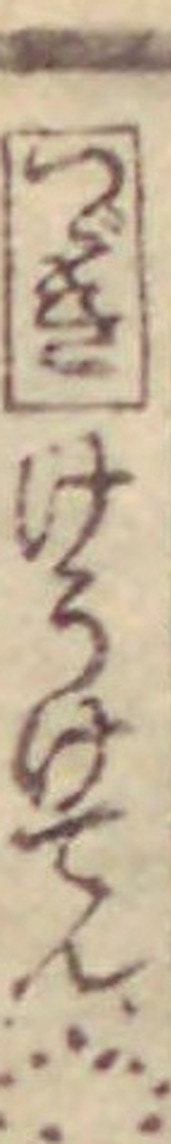つゞきけうけてん
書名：化物世帯氣質
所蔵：国立国会図書館 National Diet Library, JAPAN
